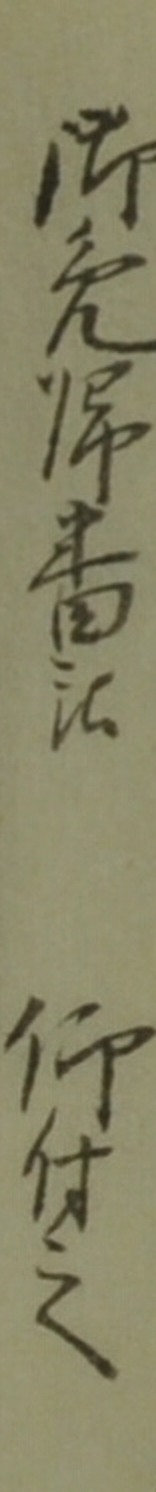御免帰番被仰付之
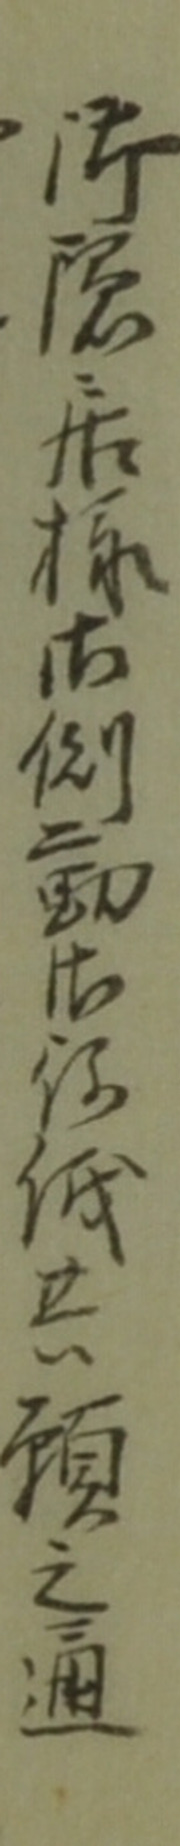御隠居様御側勤御役儀共願之通
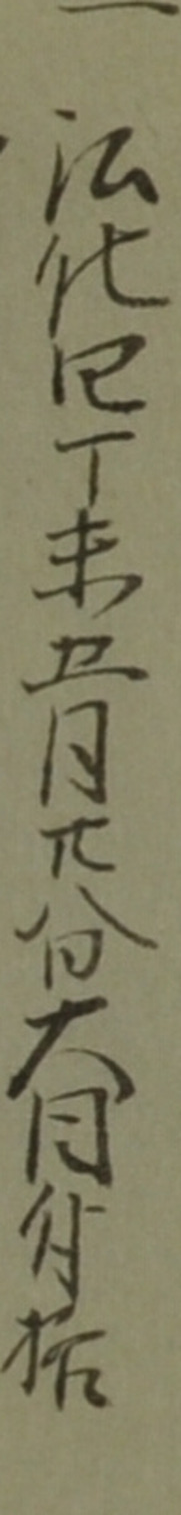一弘化四丁未五月廿八日大目付格
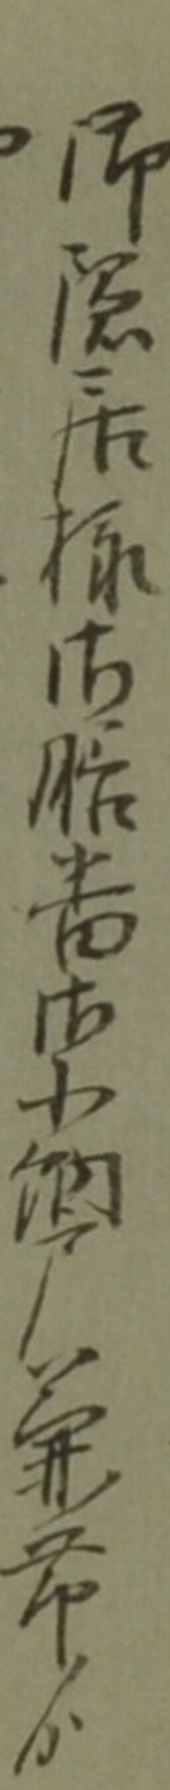御隠居様御膳番御小納戸兼帯ゟ
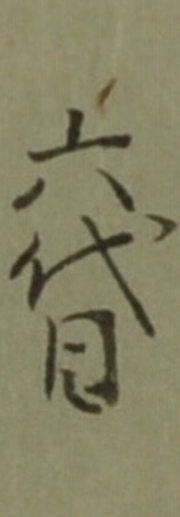六代目
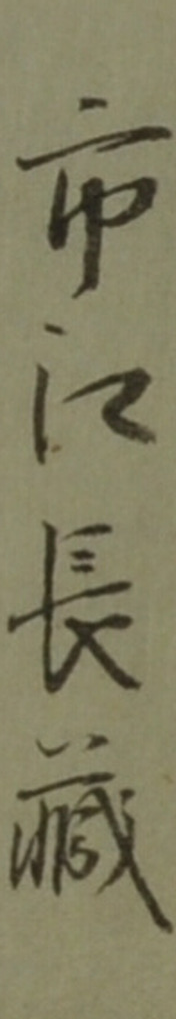市江長蔵
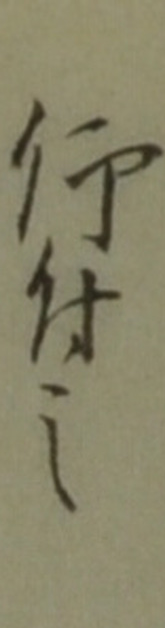仰付之
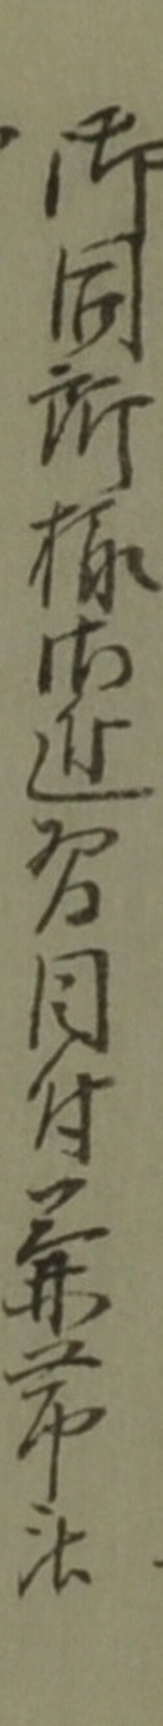御同所様御近習目付兼帯被
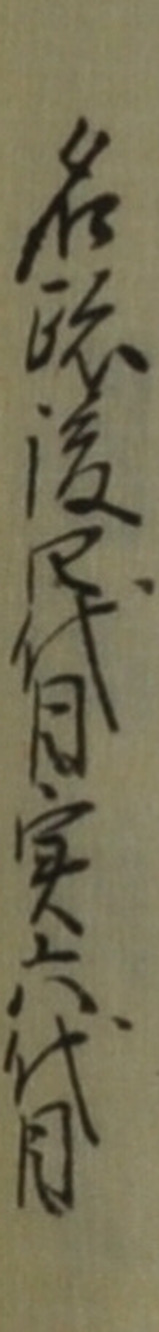名跡後四代目実六代目
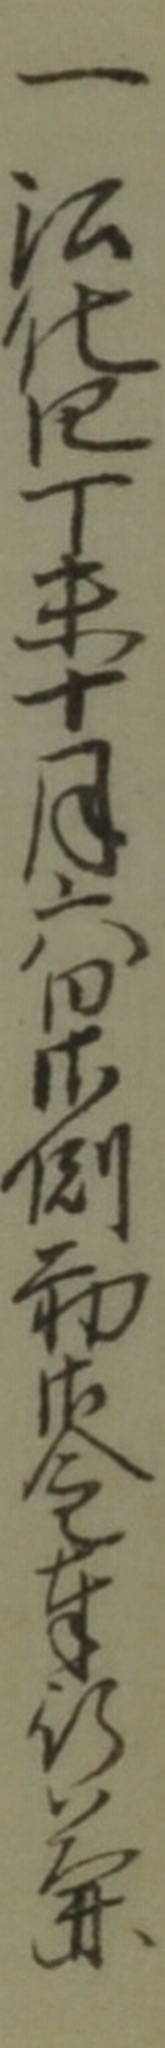一弘化四丁未十月六日御側勤御金奉行兼
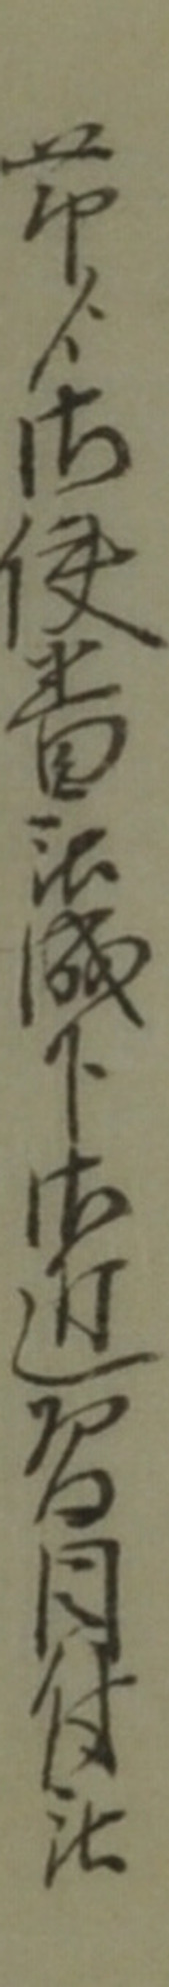帯ゟ御使番被成下御近習目付被
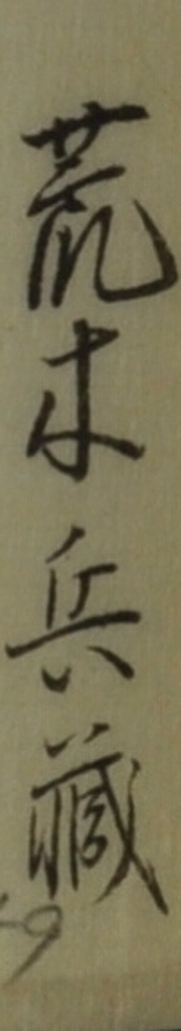荒木兵蔵
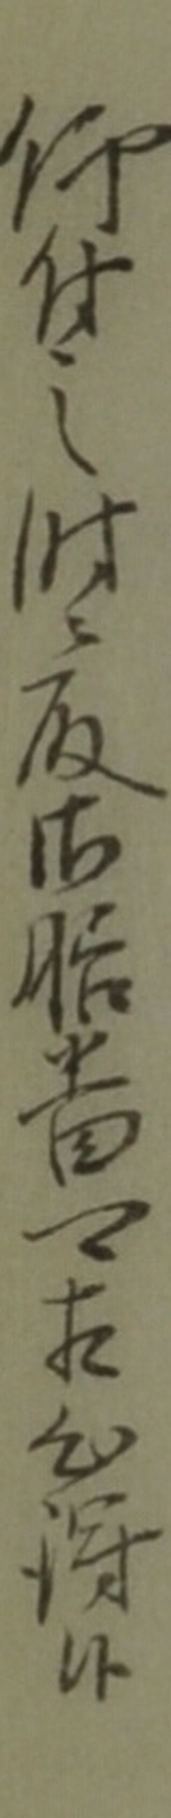仰付之時ニ取御膳番可相心得候

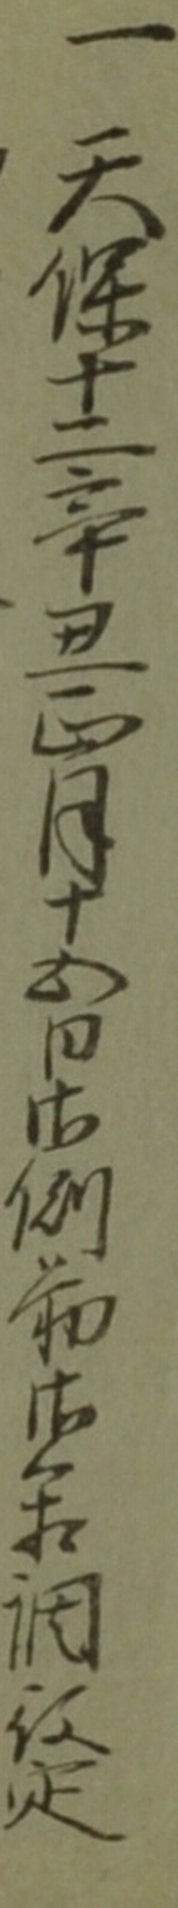一天保十二辛丑正月十五日御側勤御箱調役定
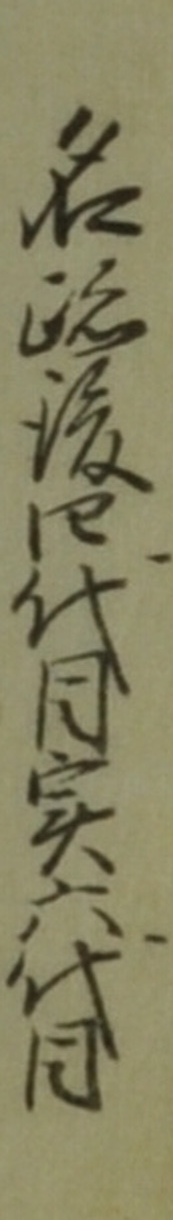名跡後四代目実六代目
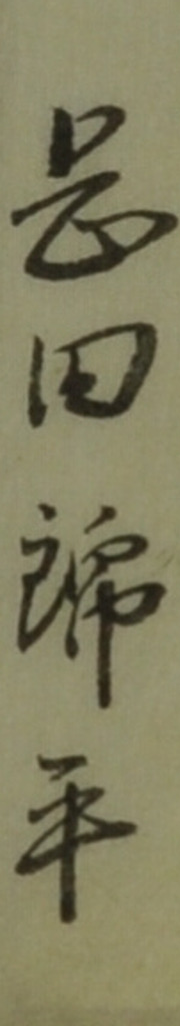岡田錦平
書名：諸御役代々録（四）
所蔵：伊那市立高遠町図書館・合同会社AMANE
